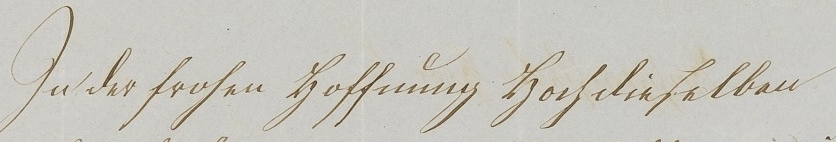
In der frohen Hoffnung Hochdieselben
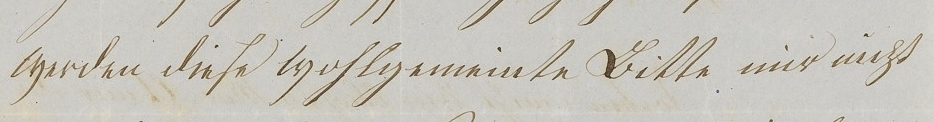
werden diese wohlgemeinte Bitte mir nicht
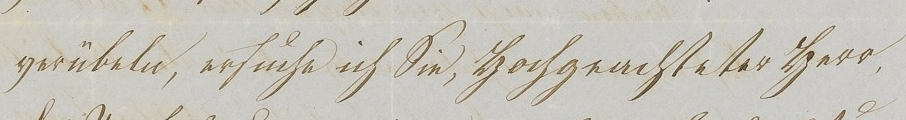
verübeln, ersuche ich Sie, Hochgeachteter Herr,
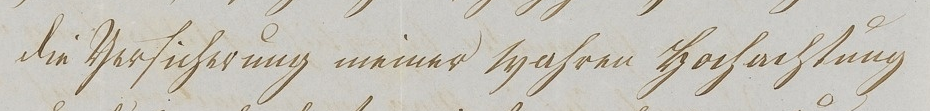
die Versicherung meiner wahren Hochachtung
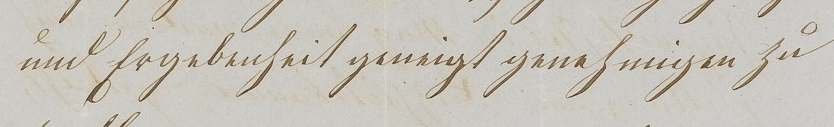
und Ergebenheit geneigt genehmigen zu
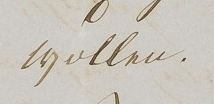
wollen.
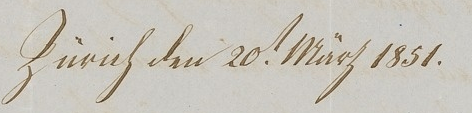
Zürich den 20t. März 1851.
